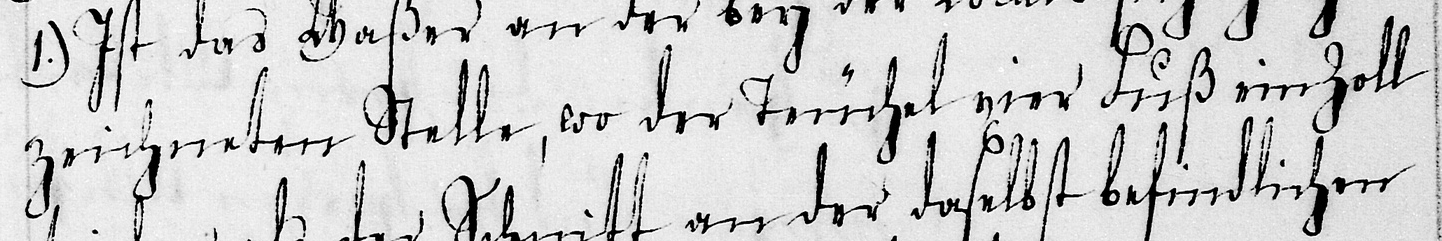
zeichneten Stelle, wo der Teuchel vier Fuß ein Zoll
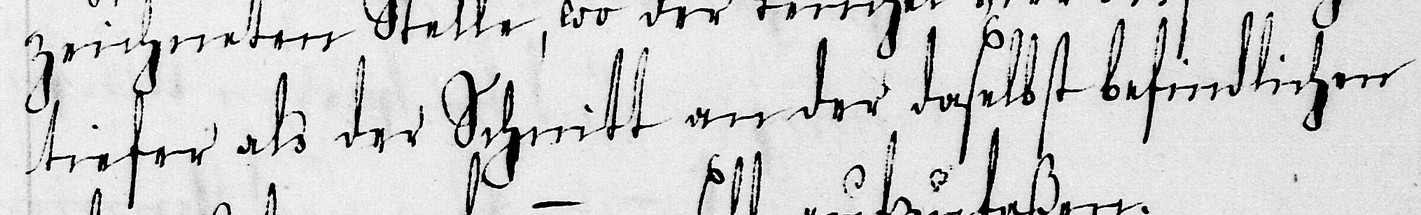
tiefer als der Schnitt an der daselbst befindlichen
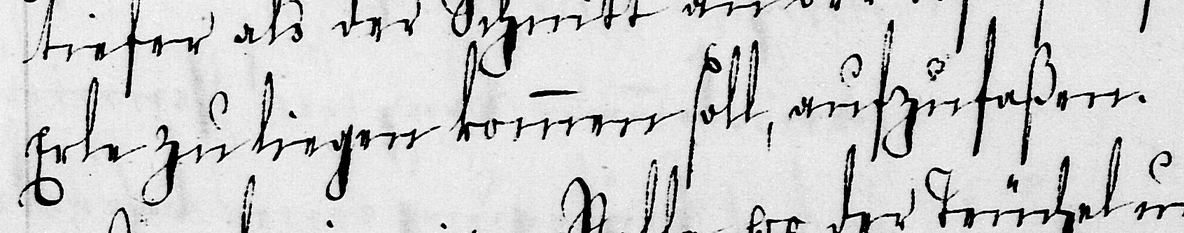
Erle zu liegen kommen soll, aufzufaßen.
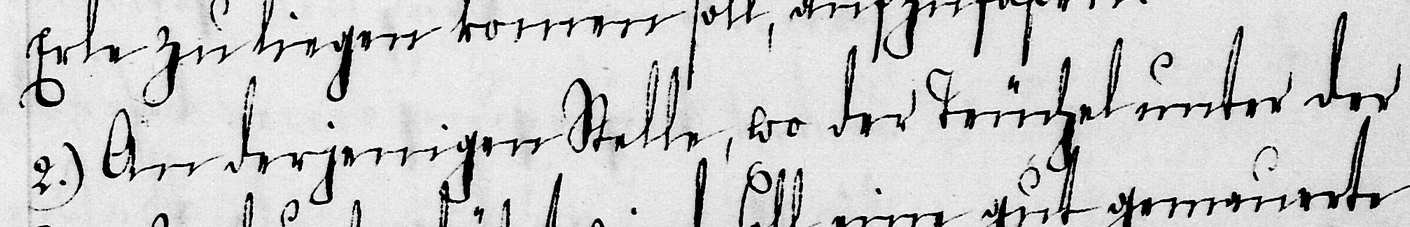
2.) An derjenigen Stelle, wo der Teuchel unter der
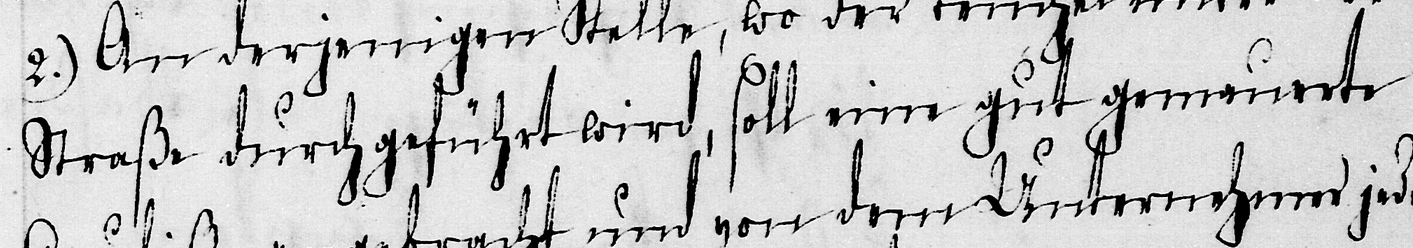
Straße durchgeführt wird, soll eine gut gemauerte
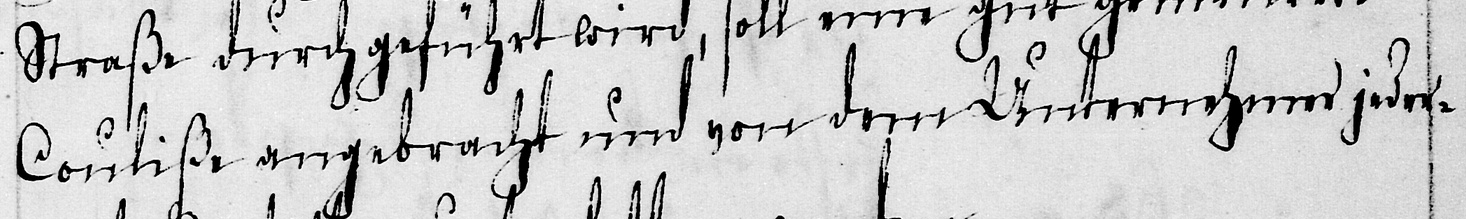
Couliße angebracht und von dem Unternehmer jeder¬
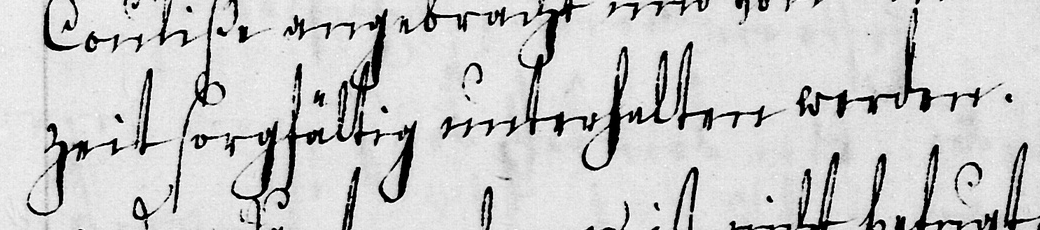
zeit sorgfältig unterhalten werden.
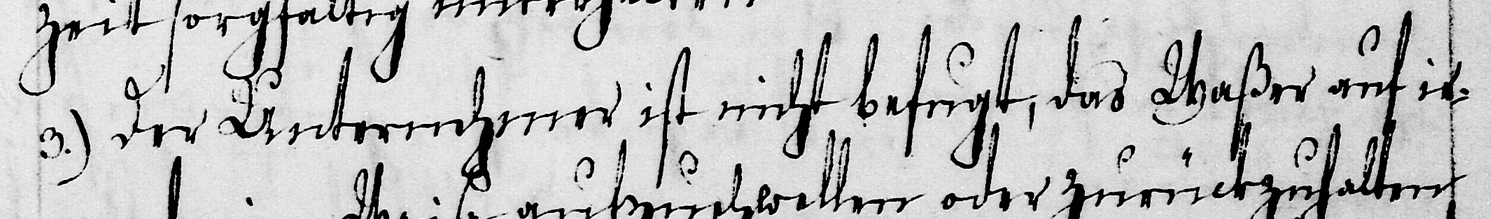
3.) Der Unternehmer ist nicht befugt, das Waßer auf ir¬
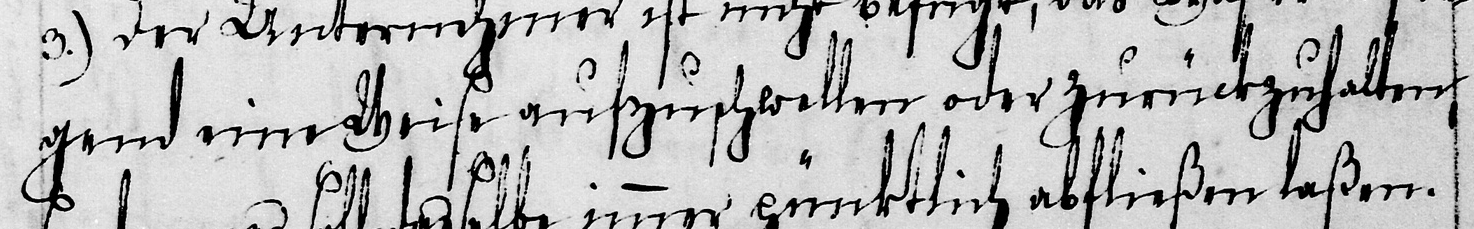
gend eine Weise aufzuschwellen oder zurückzuhalten,
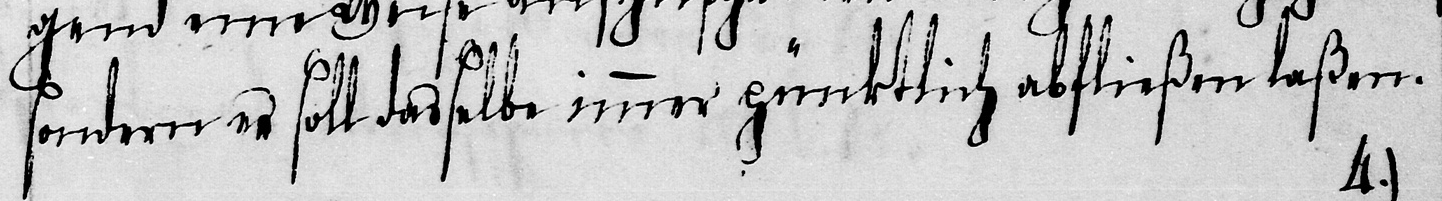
sondern er soll dasselbe immer pünktlich abfließen laßen.
